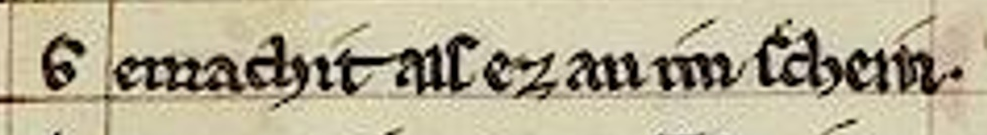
Gemachit alſ ez an im ſchein.
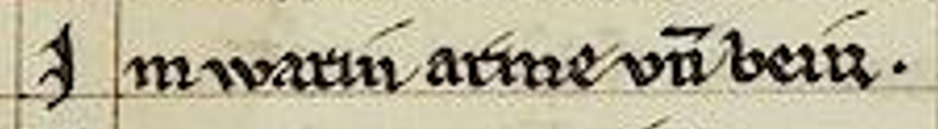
Im warin arme vn(d) bein.
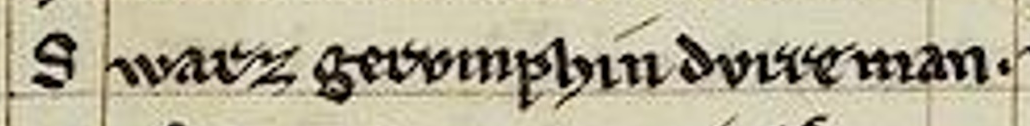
Swarz gervmphin dvrre man.
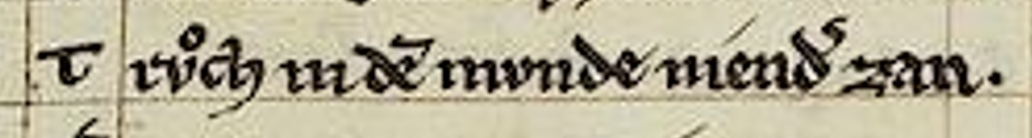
Trv°och in de(m) mvnde niend(er) zan.
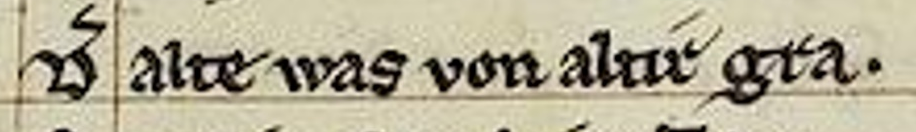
D(er) alte was von altir gra.
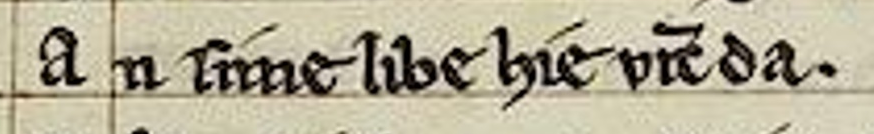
An ſime libe hie vn(d) da.
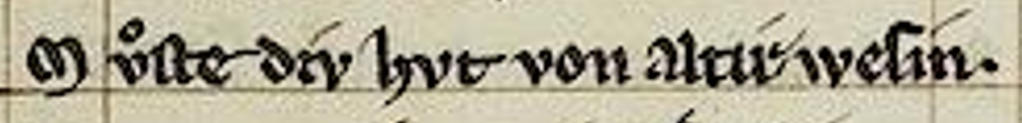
Mv°oſte div hvt von altir weſin.
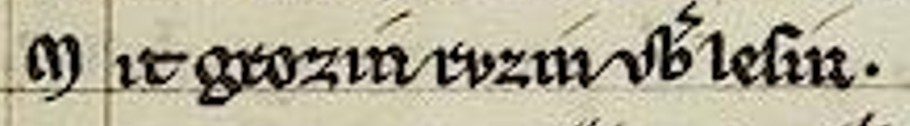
Mit grozin rvzin vb(er) leſin.
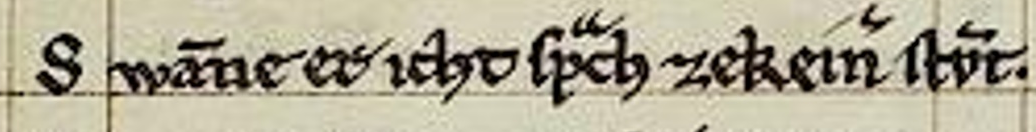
Swa(n)ne er icht sp(ra)ch zekein(er) ſtv(n)t.
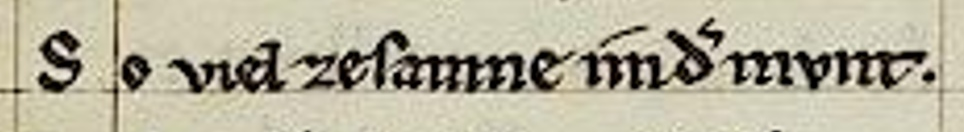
So viel zeſamne im d(er) mvnt.
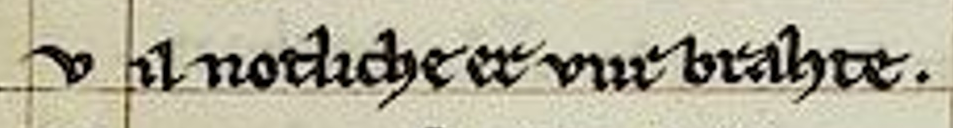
Vil notliche er vur brahte.
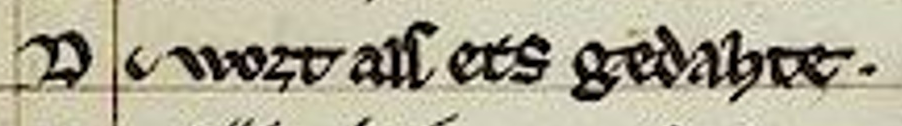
D(az) wort alſ ers gedahte.
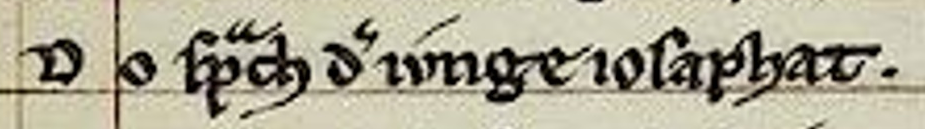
Do ſp(ra)ch d(er) ivnge ioſaphat.
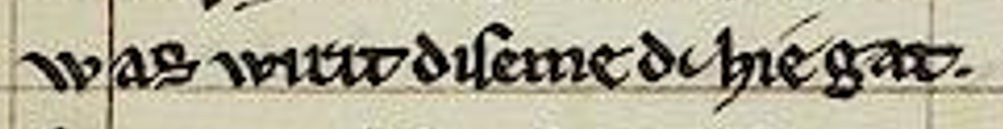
Was wirit diſeme d(az) hie gat.
